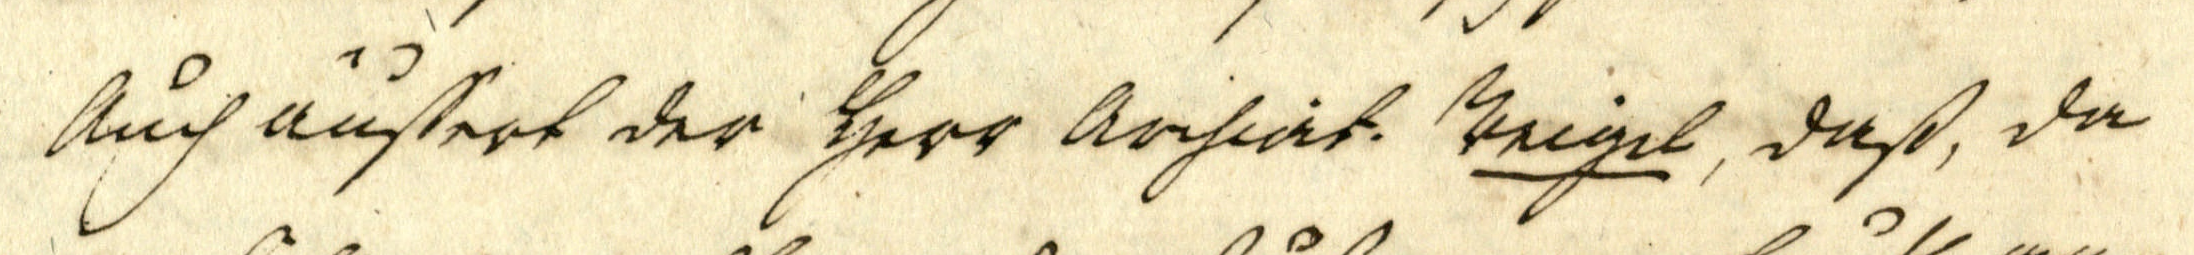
Auch äussert der Herr Archiat. Weigel, daß, da
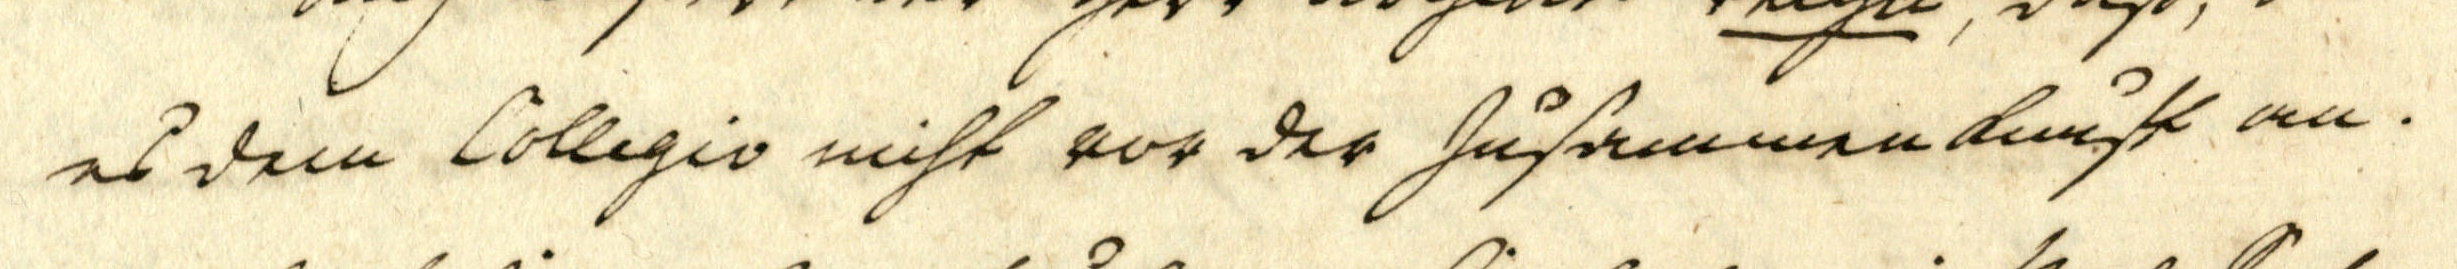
es dem Collegio nicht vor der Zusammenkunft an¬
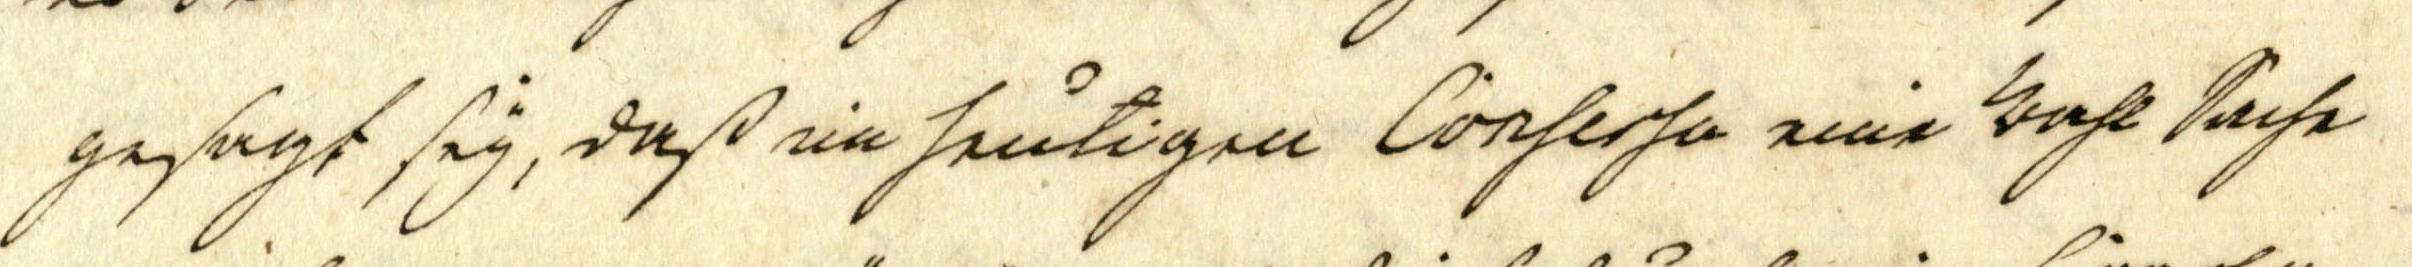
gesagt seÿ, daß in heutigen Consessu eine Wahl Sache
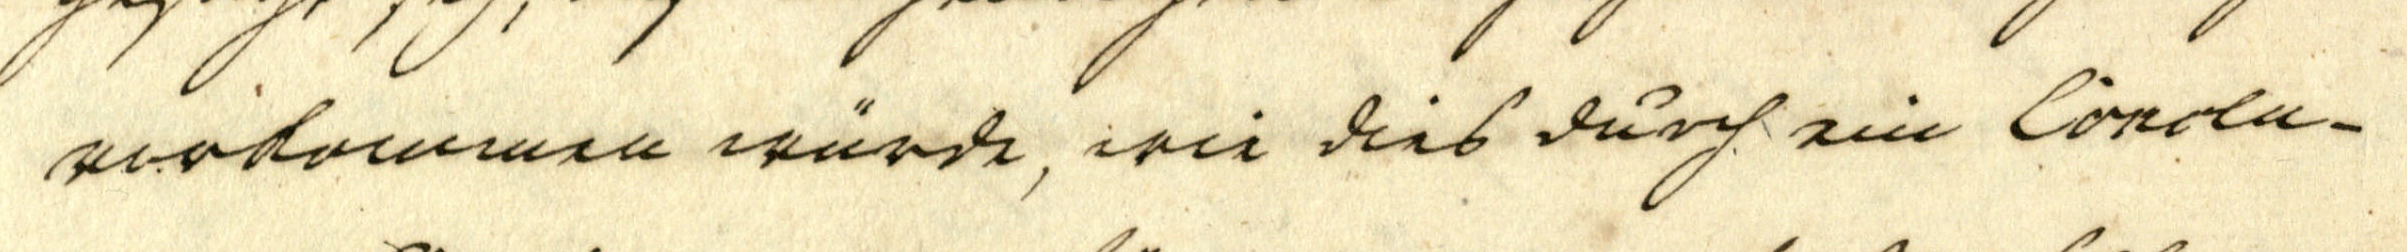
vorkommen würde, wie dies durch ein Conclu¬
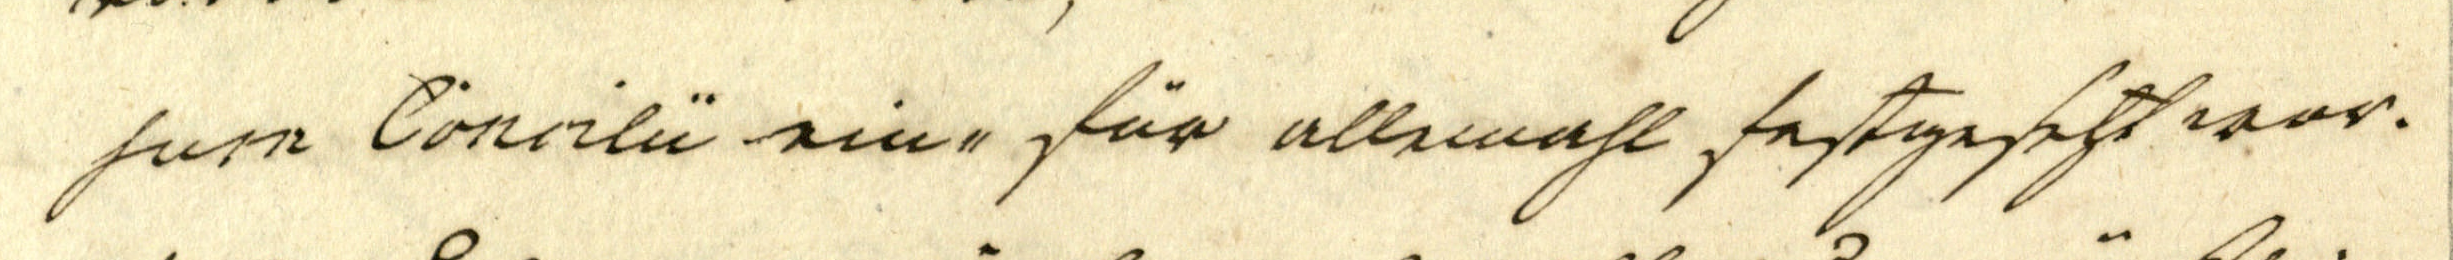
sum Concilii ein für allemahl festgesetzt wor¬
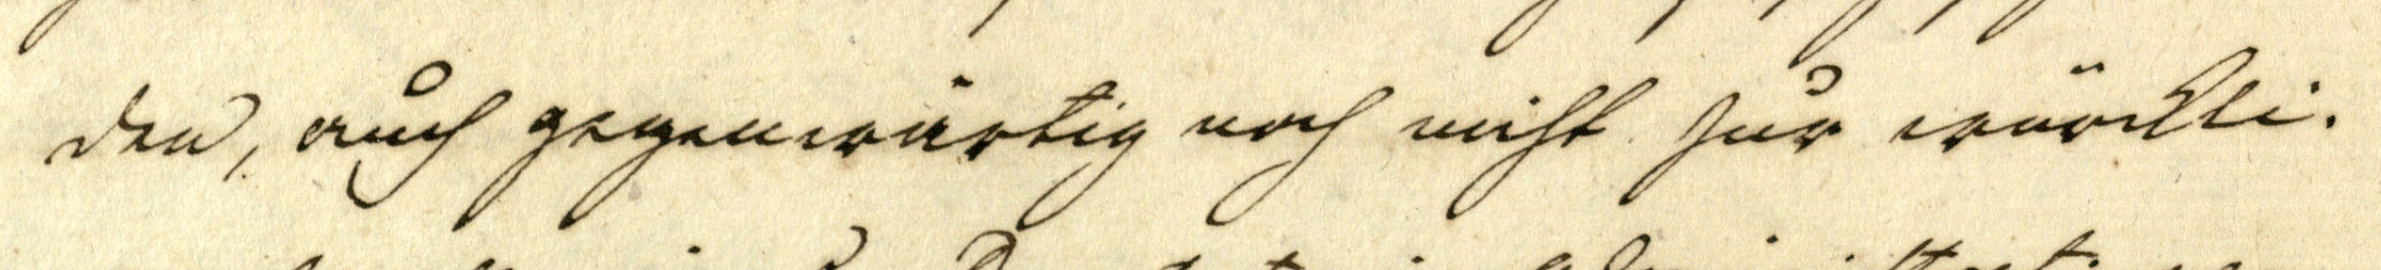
den, auch gegenwärtig noch nicht zur würckli¬
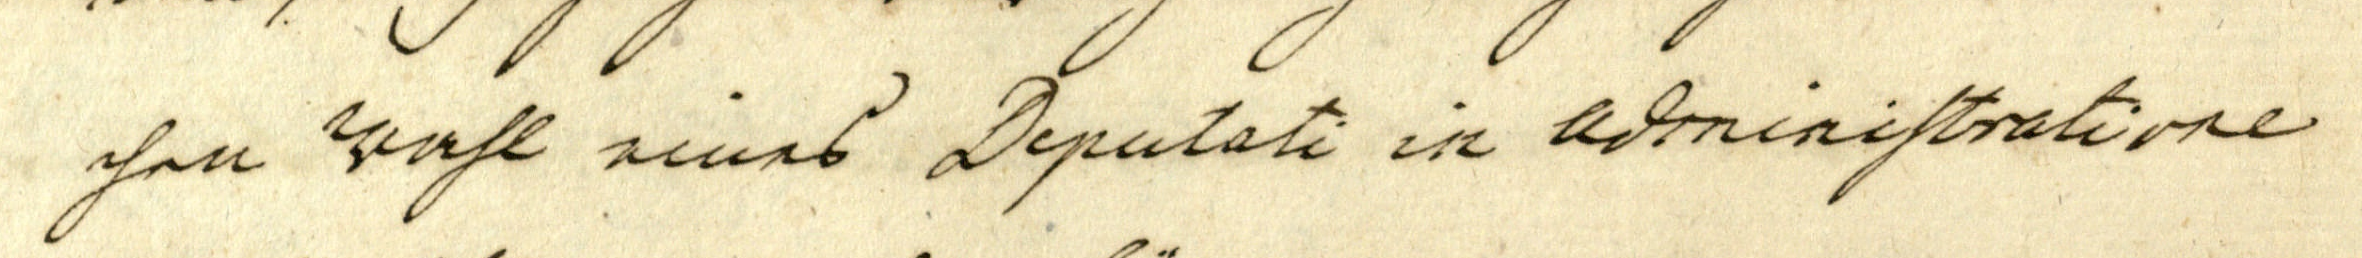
chen Wahl eines Deputati in Administratione
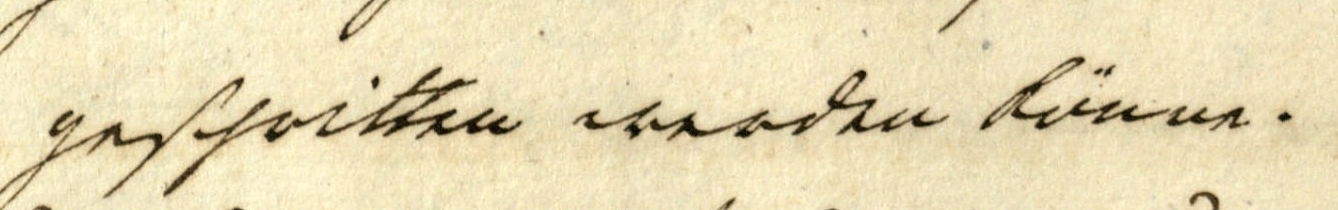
geschritten werden könne.
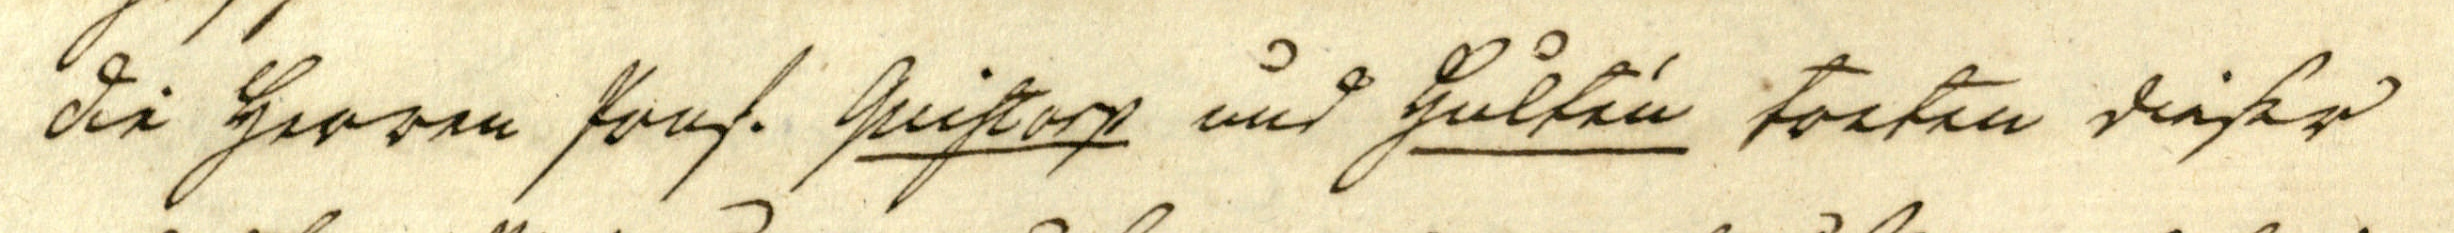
die Herren Prof. Quistorp und Hultén treten dieser
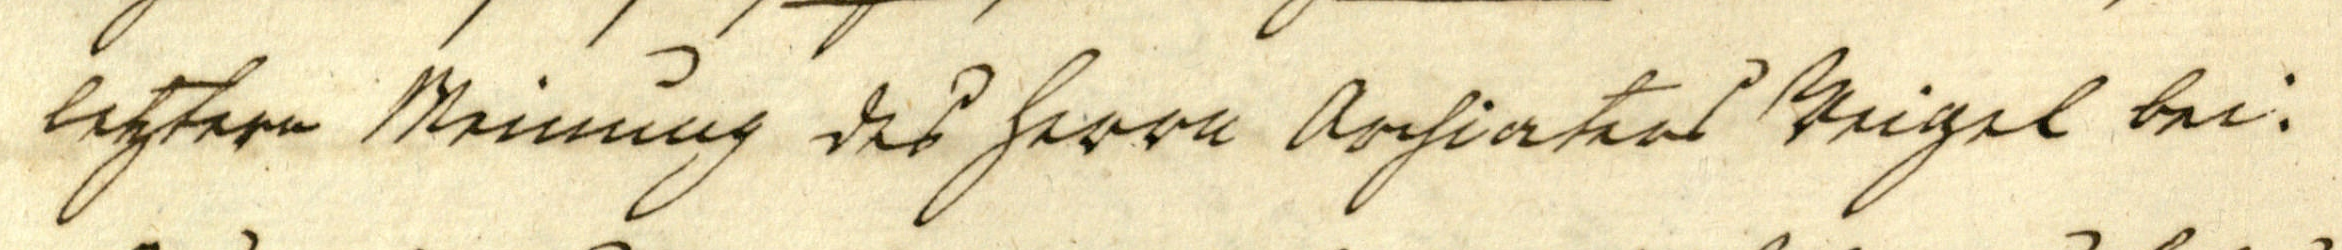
letztern Meinung des Herrn Archiaters Weigel bei.
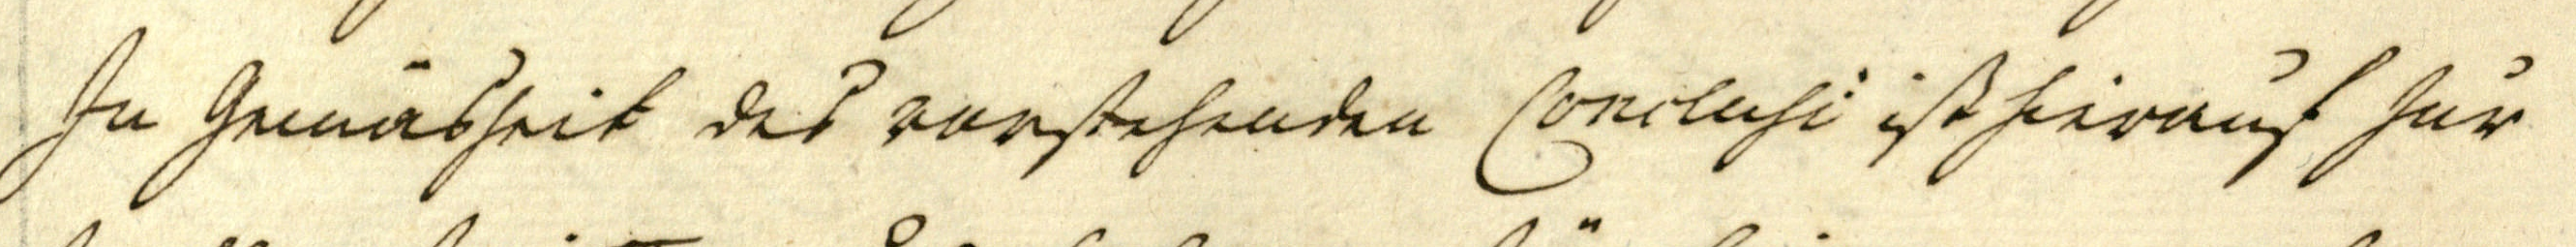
In Gemäsheit des vorstehenden Conclusi ist hierauf zur
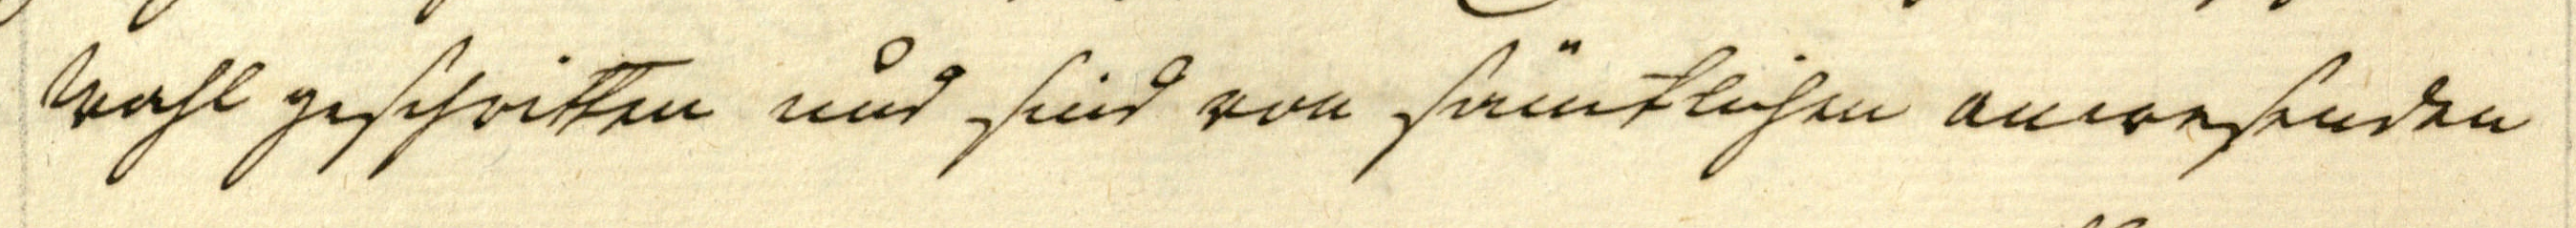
Wahl geschritten und sind von sämtlichen anwesenden
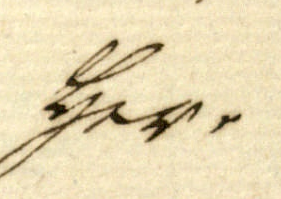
Her¬
